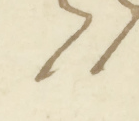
77
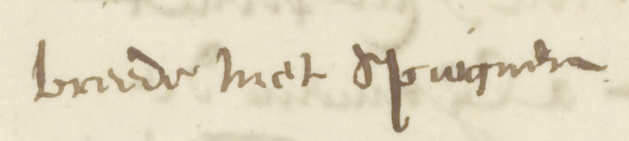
vreede met Spaignen
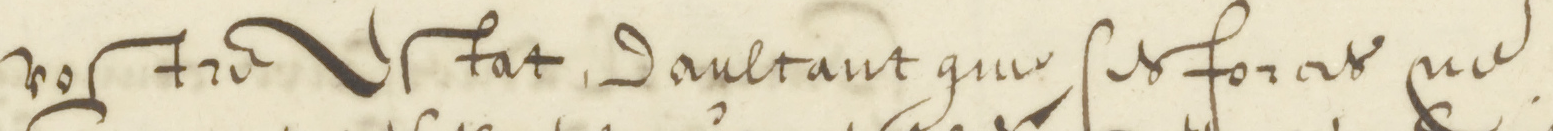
vostre Estat, Daultant que ses forces ne
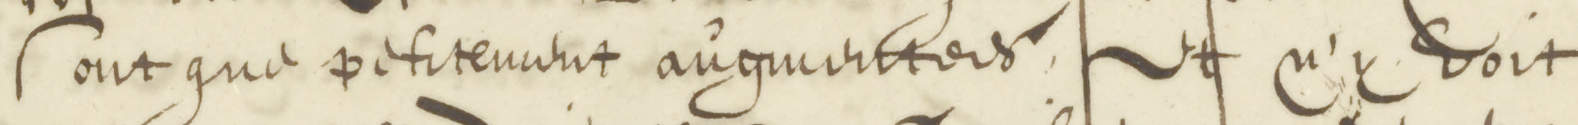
sont que petitement augmentees et n‛y voit
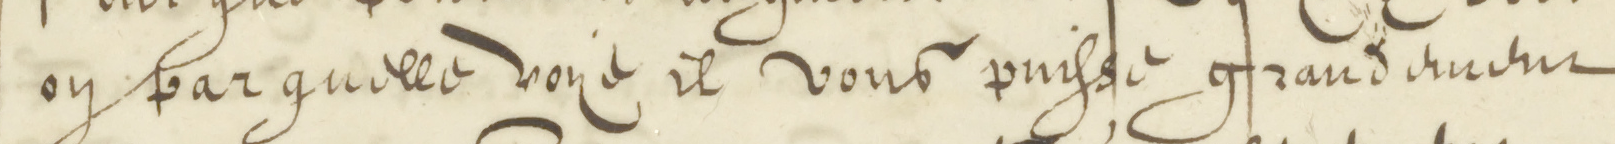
ou par quelle voye il vous puisse grandement
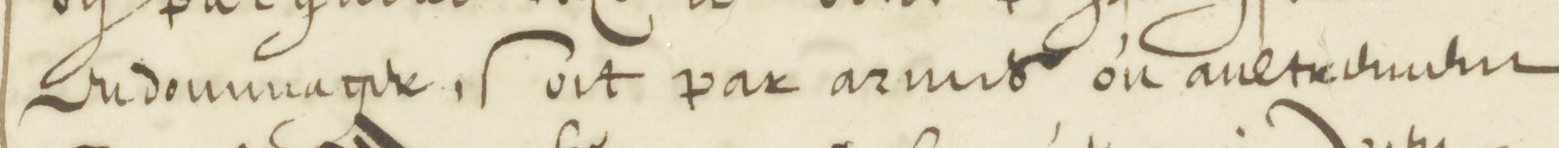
endommager, soit par armes ou aultrement
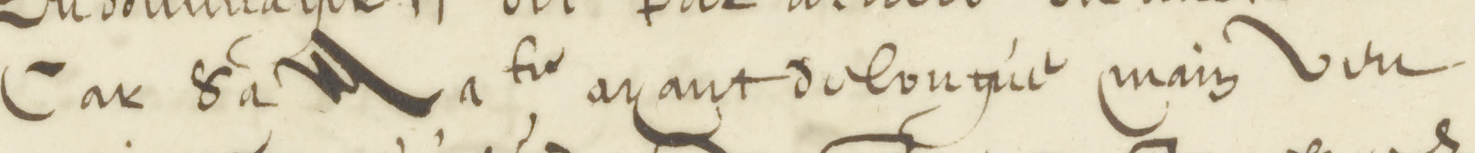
Car Sa Mate. ayant delongue main veu
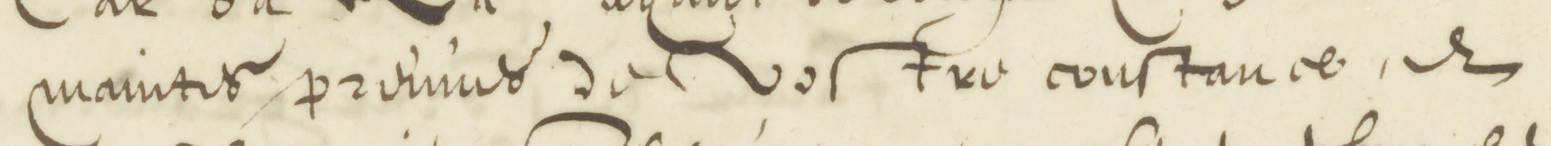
maintes, preuues de vostre constance, et
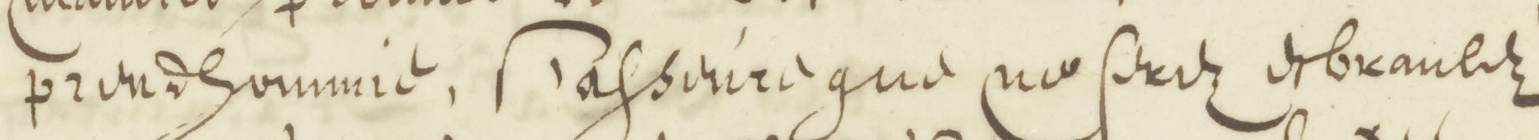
prendhommie, s‛asseure que ne serez esbraulez
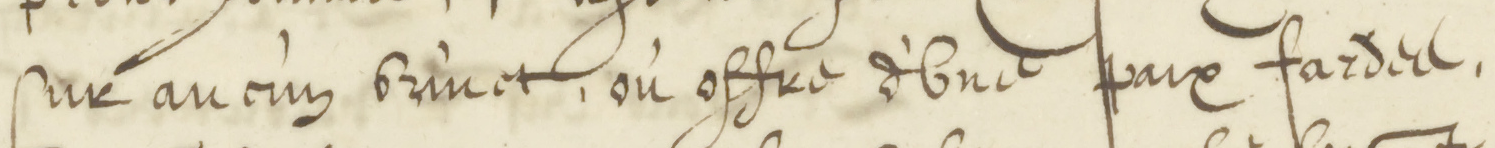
sur aucun bruict, ou offre d‛une paix fardee
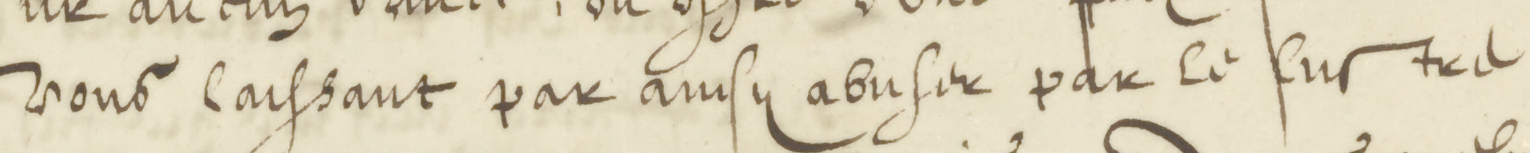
vous laissant par ainsy abuser par le lustre
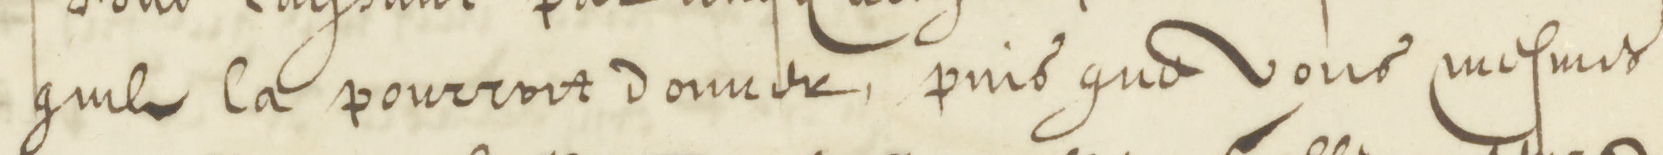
quil la pourroit donner, puis que vous mesmes
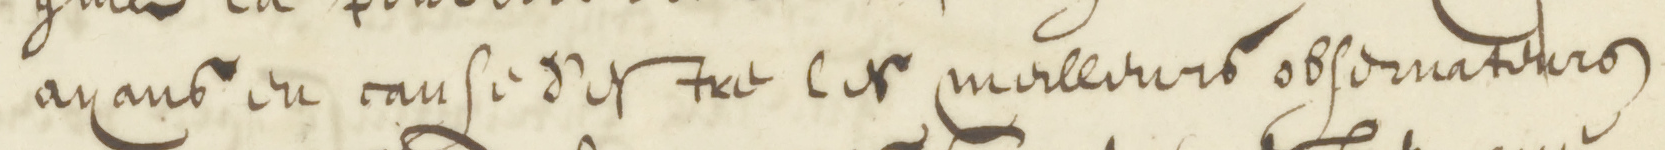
ayans en cause d‛estre les meilleurs obseruateurs
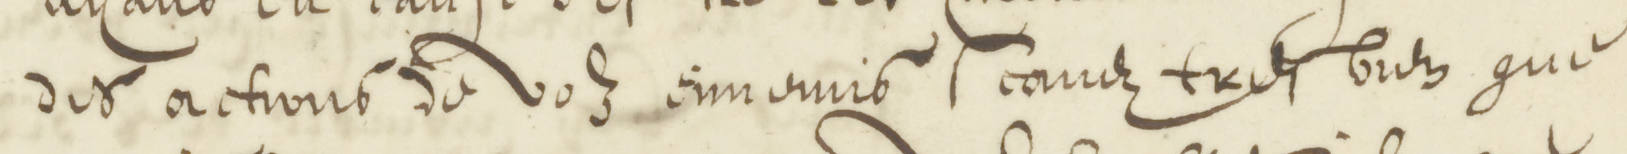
des actions de voz ennemis scauez tres bien que
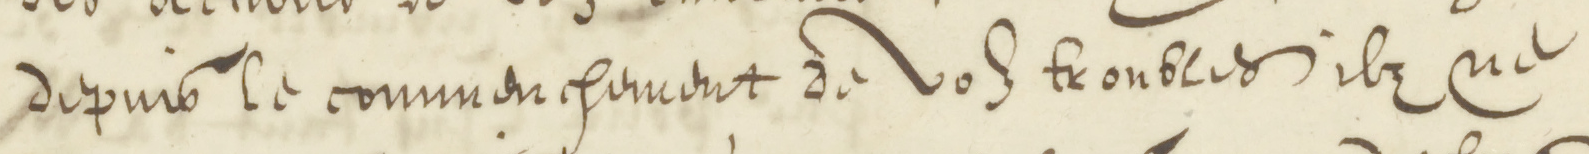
depuis le commenchement de voz troubles ilz ne
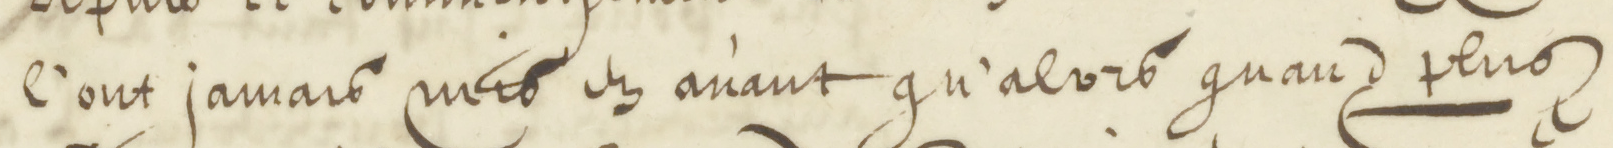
l‛ont jamais mis en auant qu‛alors quand plus
